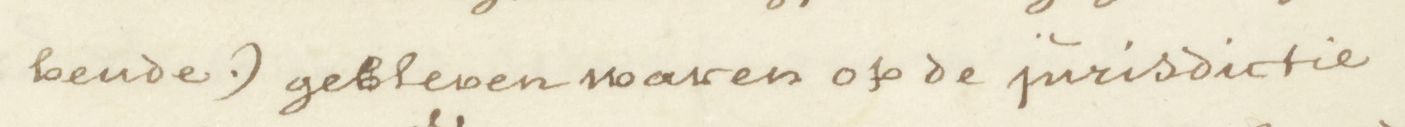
bende .) gebleven waren op de jurisdictie
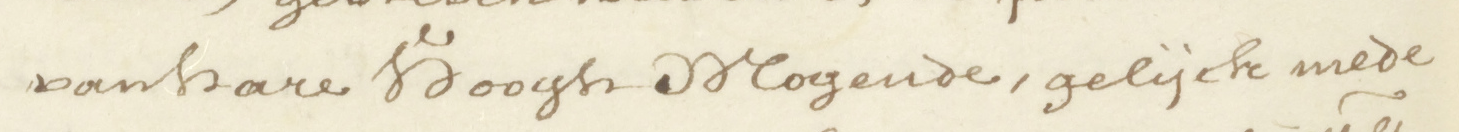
van hare Hoogh Mogende, gelijck mede
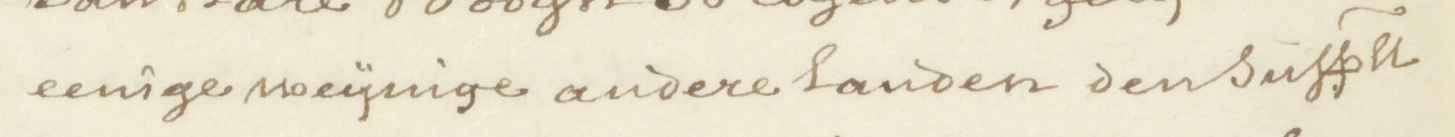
eenige weijnge andere landen den supplt
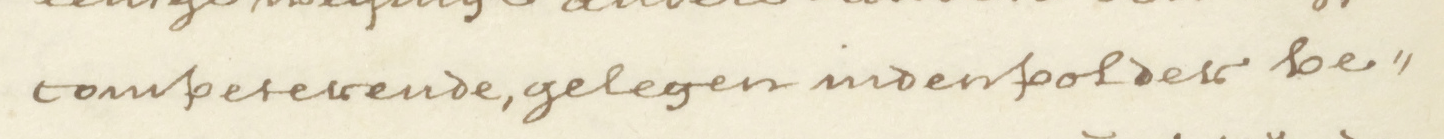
competerende gelegen inden polder be„
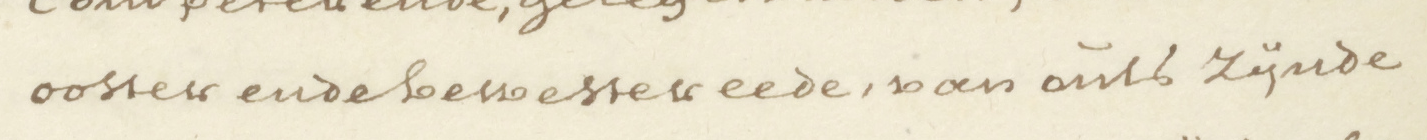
ooster ende bewester eede, van outs zijnde
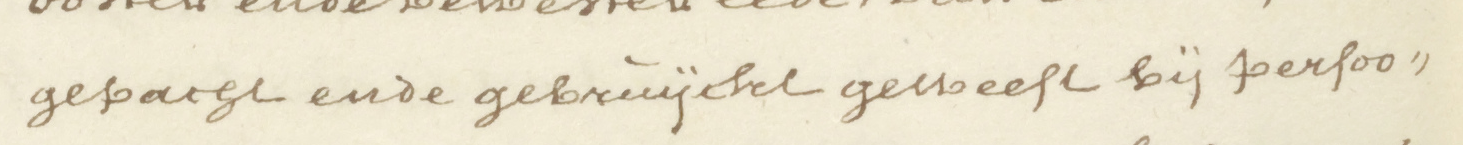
gepacht ende gebruijckt geweest bij persoo,
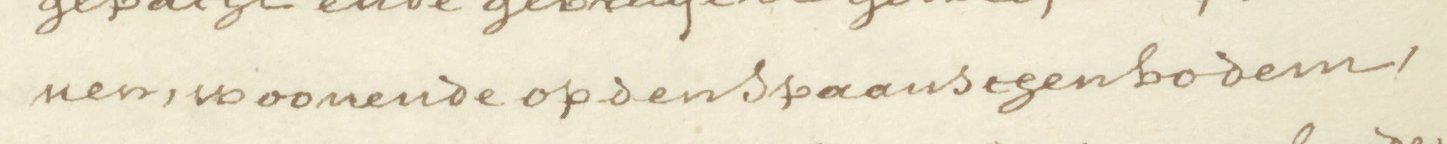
nen, woonende op den spaanschen bodem,
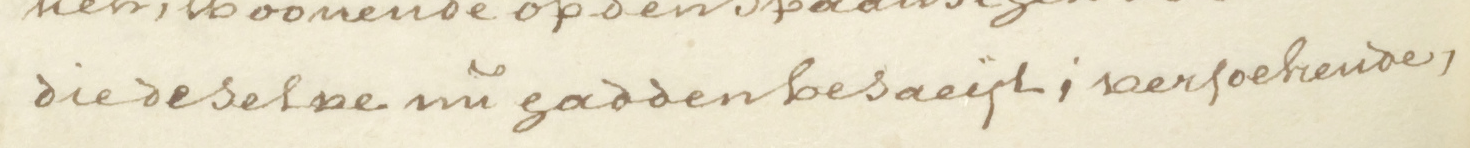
die deselve nu hadden besaeijt; versoekende,
